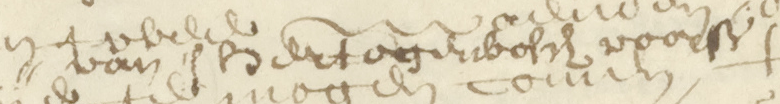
van ‛s Hertogenbosch voors
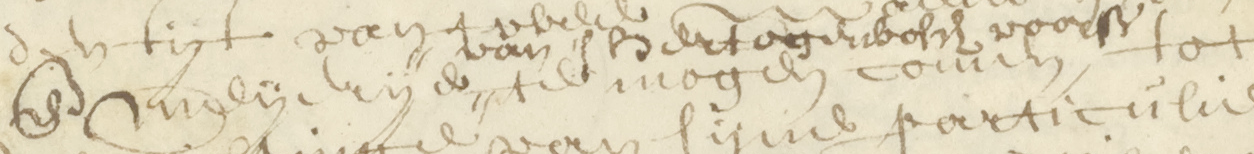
& Meijerije, te mogen comen tot
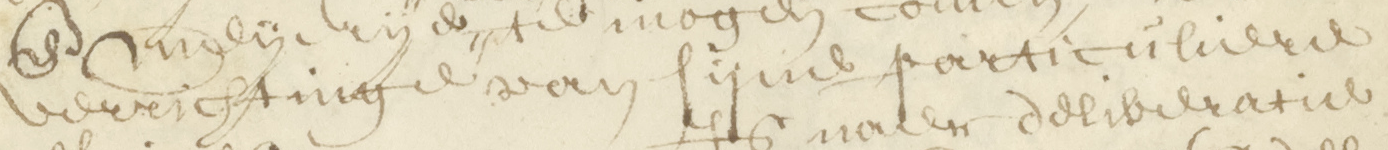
verrichtinge van sijne particuliere
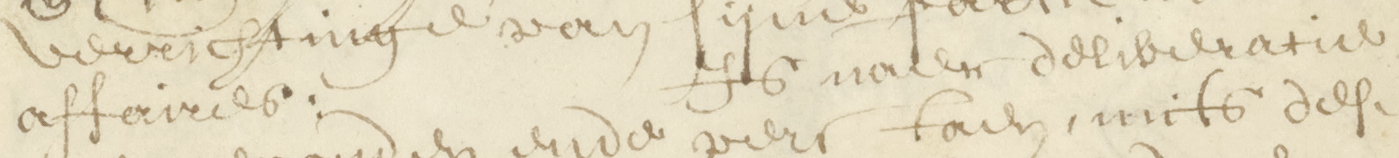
affaires: Is naer deliberatie
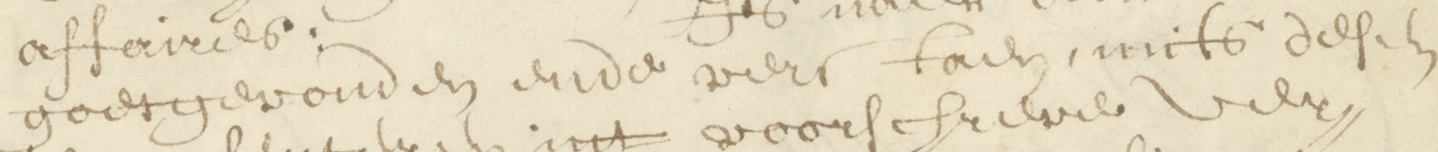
goetgevonden ende verstaen, mits desen
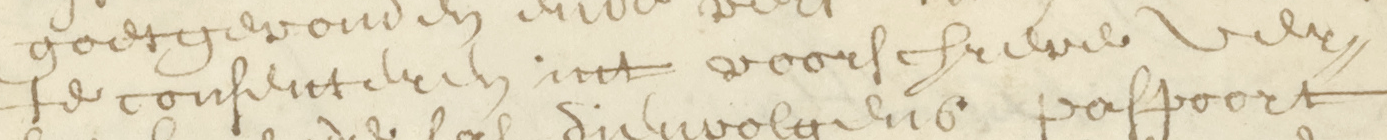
te consenteren int voorschreve ver„
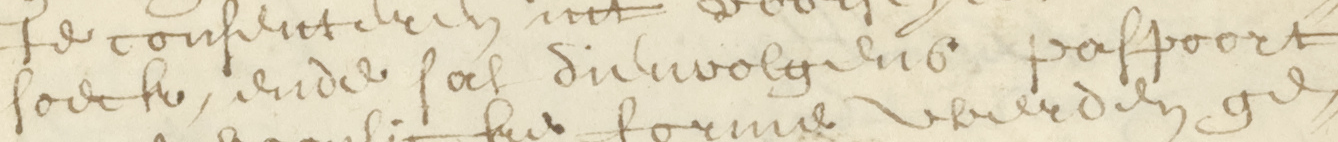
soeck, ende sal dienvolgens paspoort
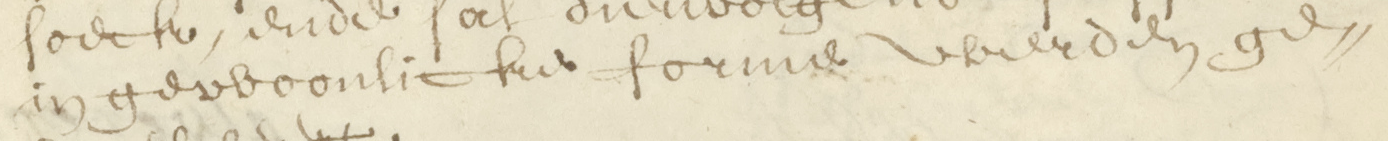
in gewoonlicke forme werden ge„
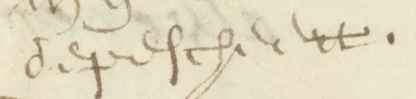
depescheert.
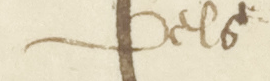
Pels
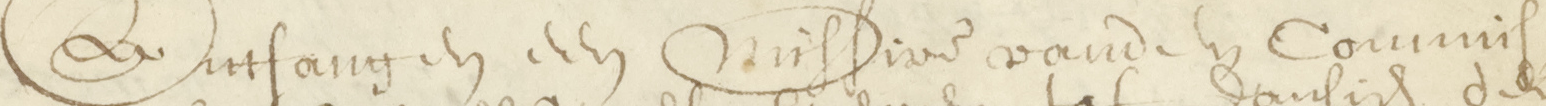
Ontfangen een Missive vanden Commis„
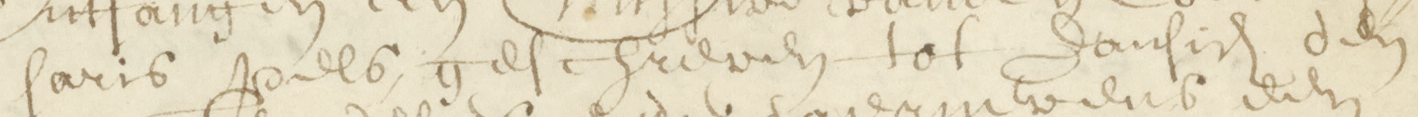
saris Pels geschreven tot Dansich den
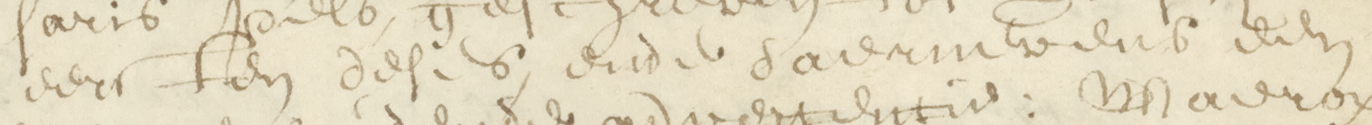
eersten deses, ende daernevens den
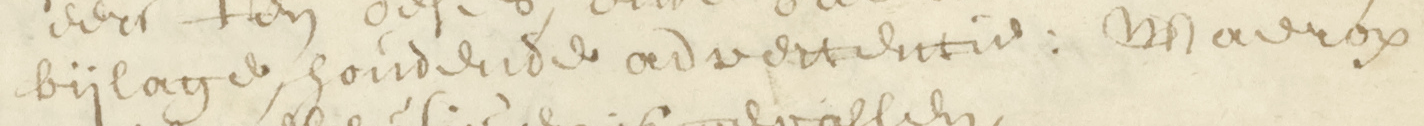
bijlage, houdende advertentie: Waerop
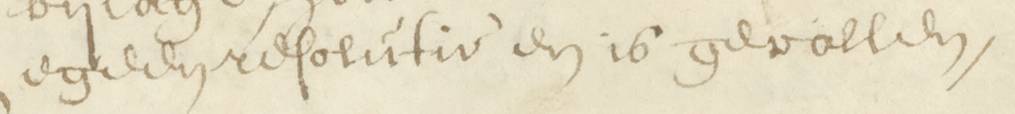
egeen resolutie en is gevallen.
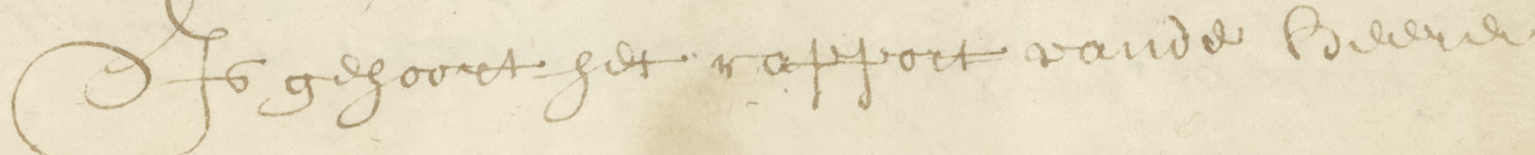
Is gehoort het rapport vande Heeren
